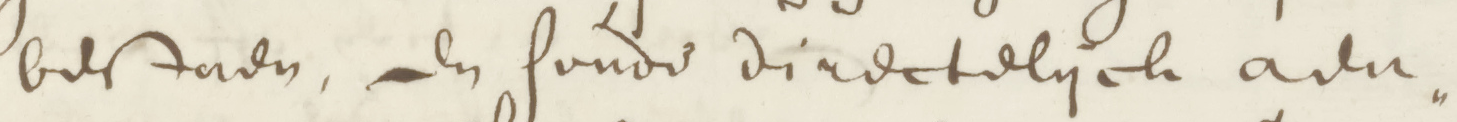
bestaen, en soude directelijck aen„
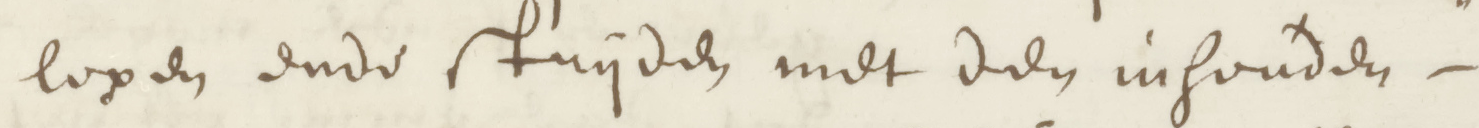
lopen ende strijden met den inhouden
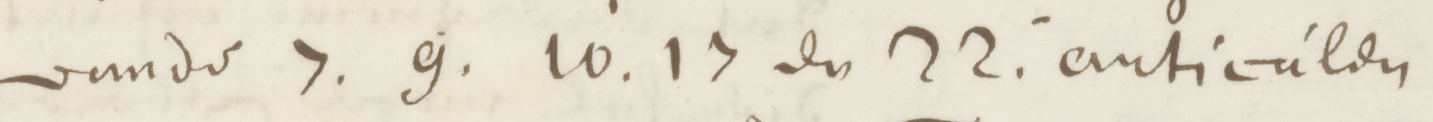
vande 7. 9. 10. 17 en 22. articulen
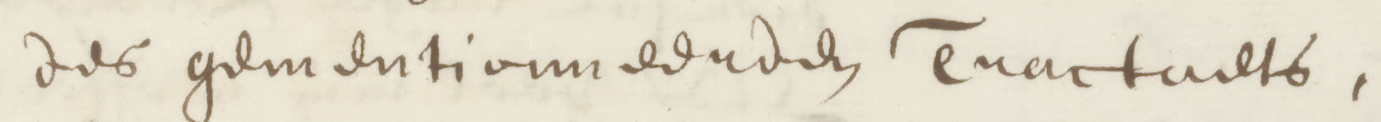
des gementionneerden Tractaets;
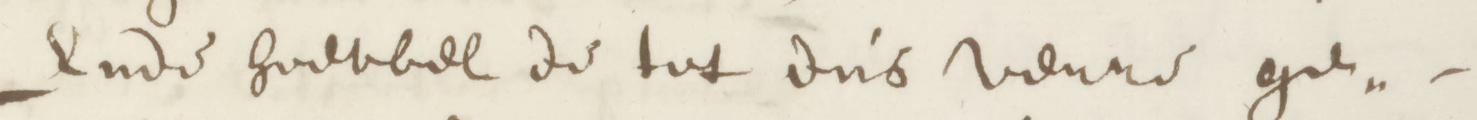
Ende hoewel de tot dus verre ge„
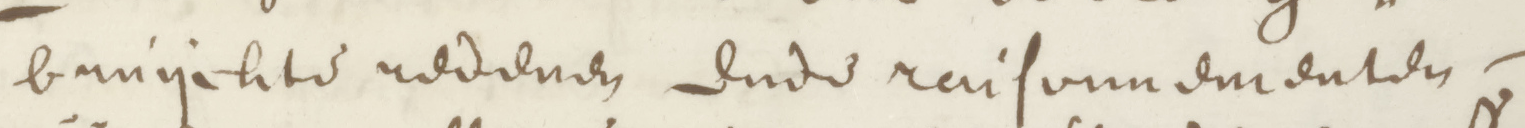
bruijckte redenen ende raisonnementen
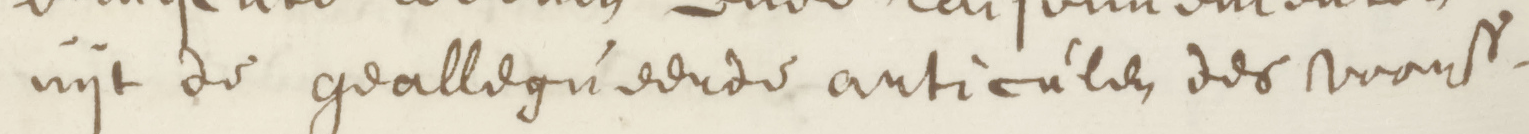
uijt de geallegueerde articulen des voors.
